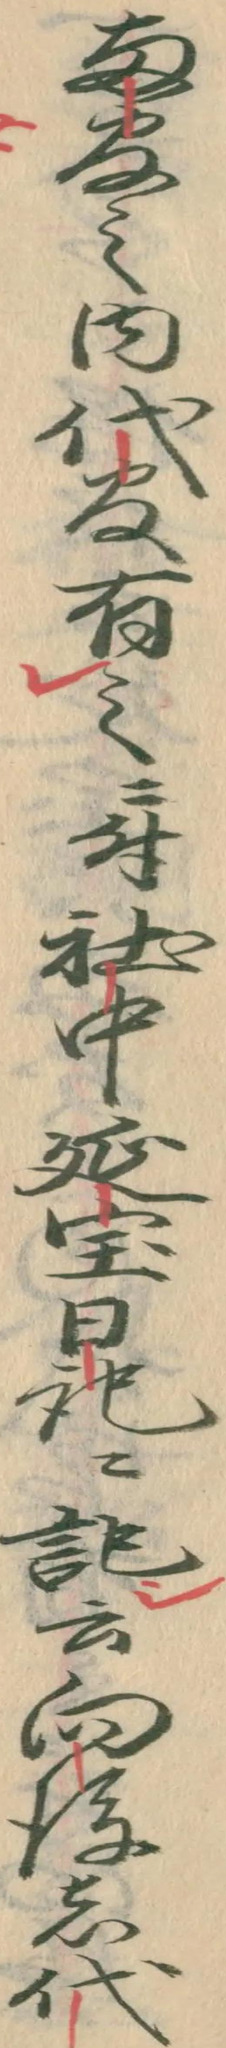両-官之内代-官有之ニ付社-中延-宝日-記ニ記云向-後者代-

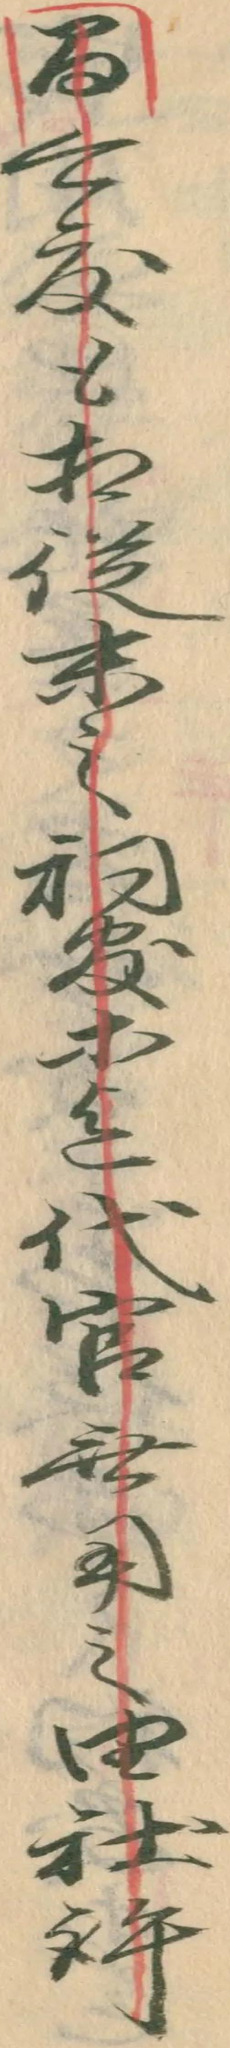間今度も相従末之祠官等迄代官無用之由社許
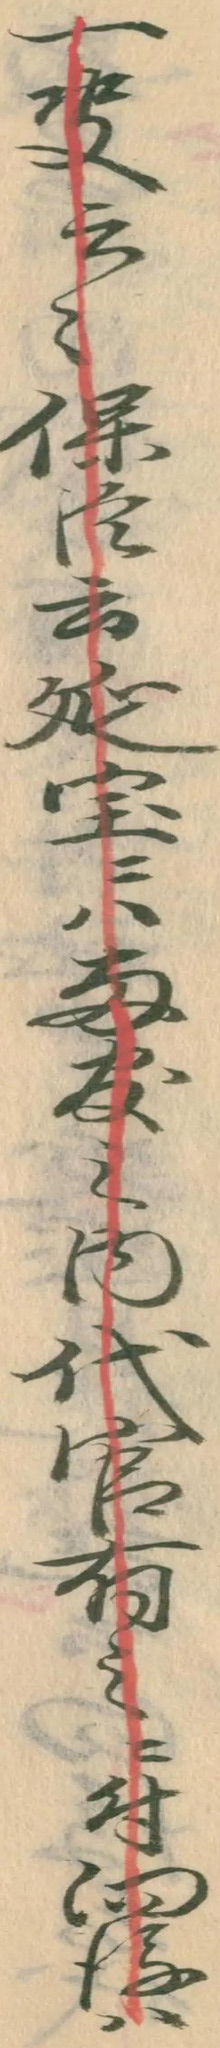一決云々保臣云延宝ニハ両官之内代官有之ニ付向後ハ
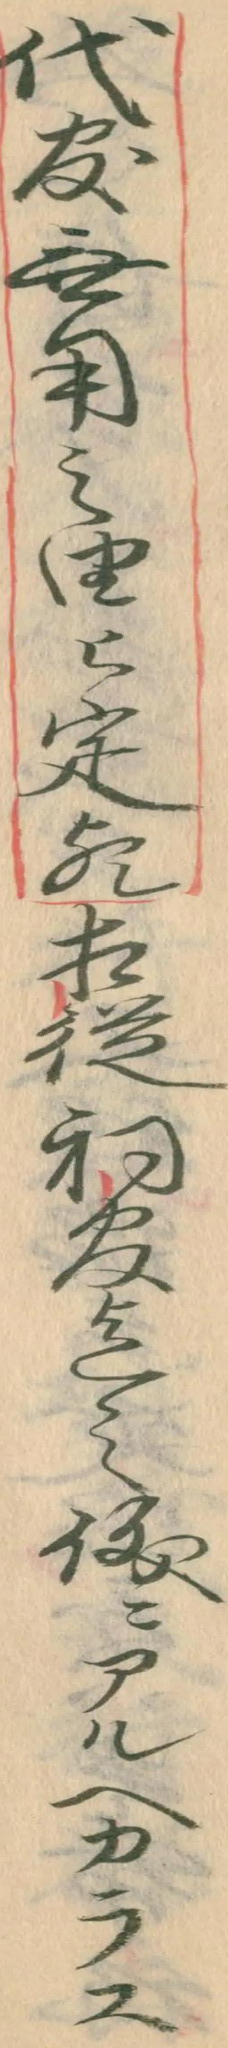代官無用之由被定歟相_従祠-官迄之儀ニアルヘカラス
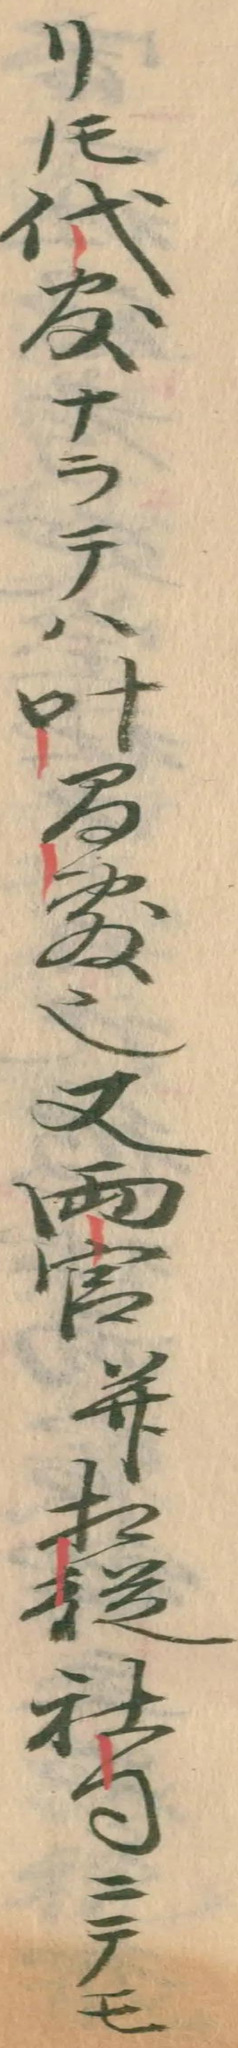リトモ代-官ナラテハ叶_間_敷也又両-官并相_従社-司ニテモ
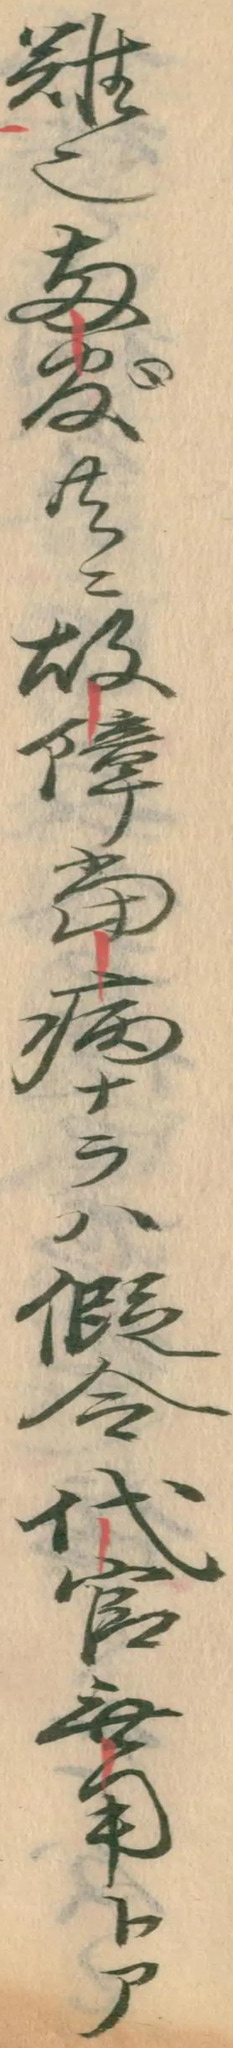難也両-官共ニ故-障当-病ナラハ仮令代-官無-用トア
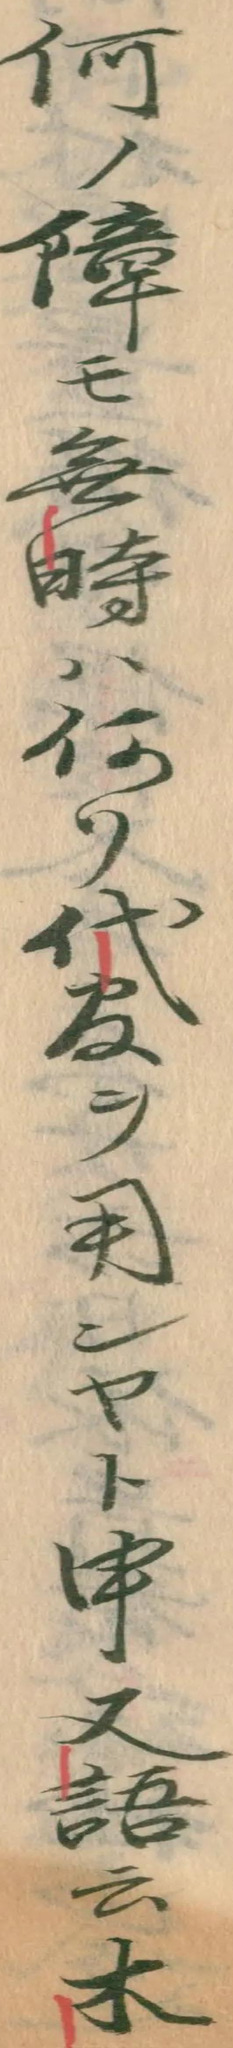何ノ障モ無_時ハ何ソ代-官ヲ用ンヤト申又_語云木_
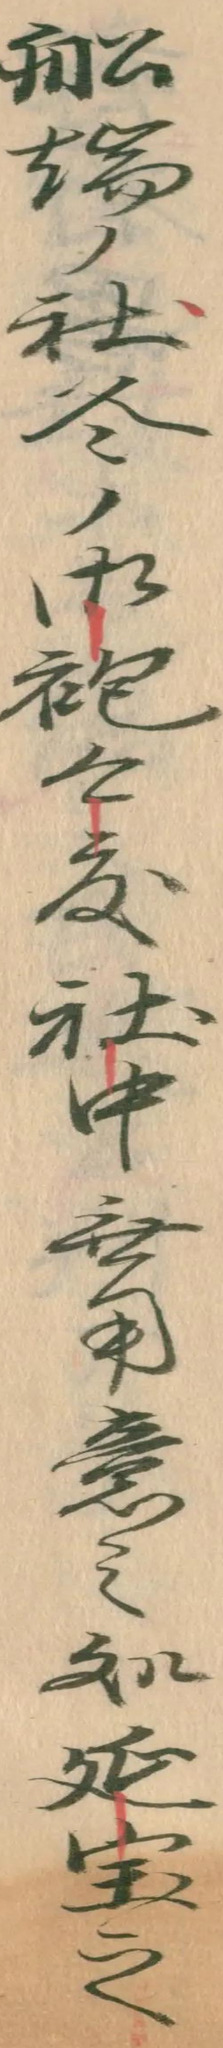船端ノ社冬ノ御-袍今-度社-中無用意之処延-宝之
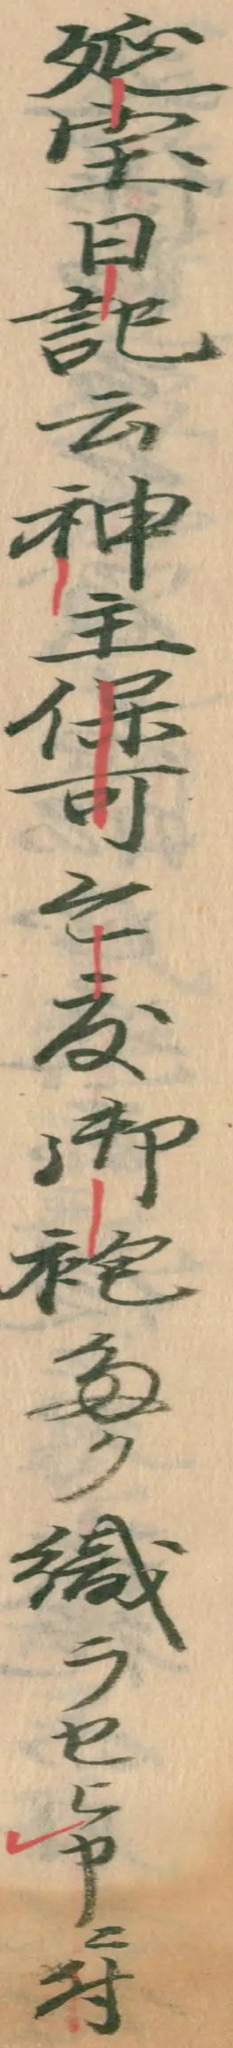延-宝日-記云神_主保可今-度御-袍多ク織ラセ被申ニ付
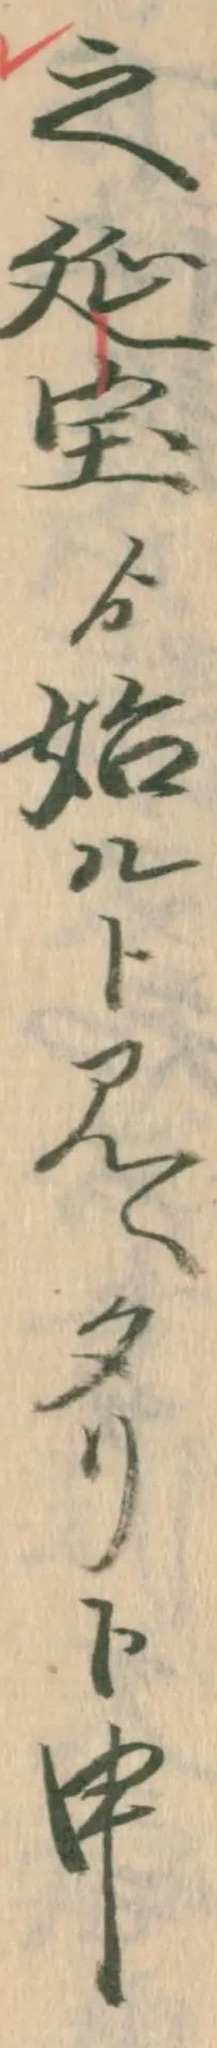之延-宝ゟ始ルト見へタリト申
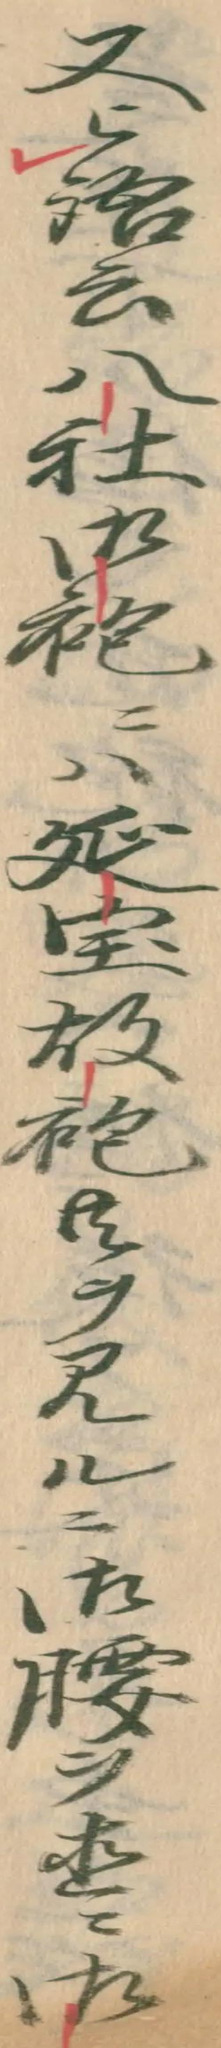又被語云八-社御-袍ニハ延-宝故-袍共ヲ見ルニ御腰ヲ直ニ御-
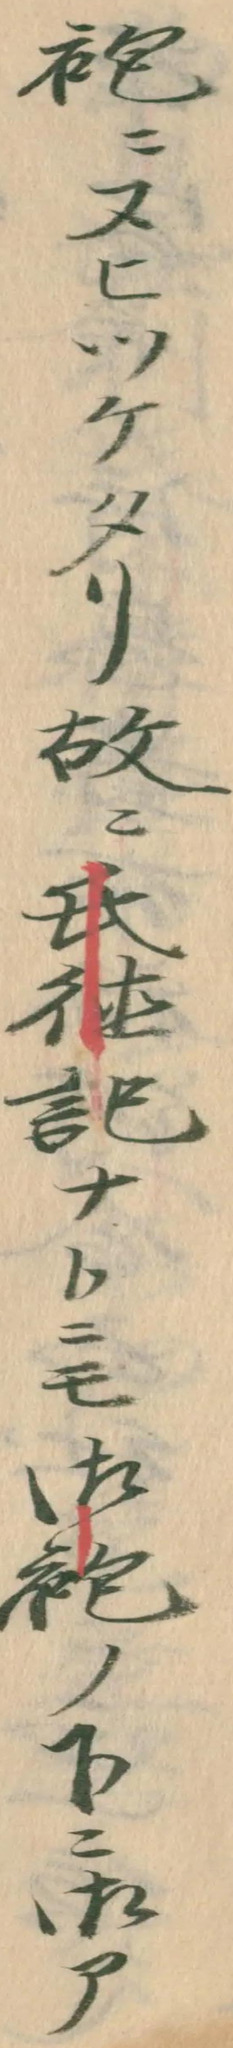袍ニヌヒツケタリ故ニ氏徳-記ナトニモ御-袍ノ下ニ御ア
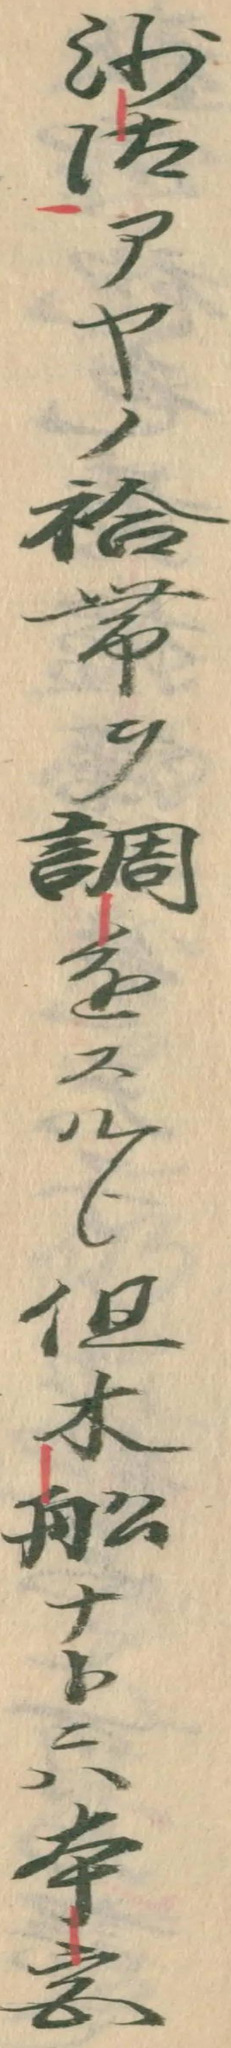沙-汰アヤノ袷帯ヲ調-進スルも但木_船ナトニハ本-宮
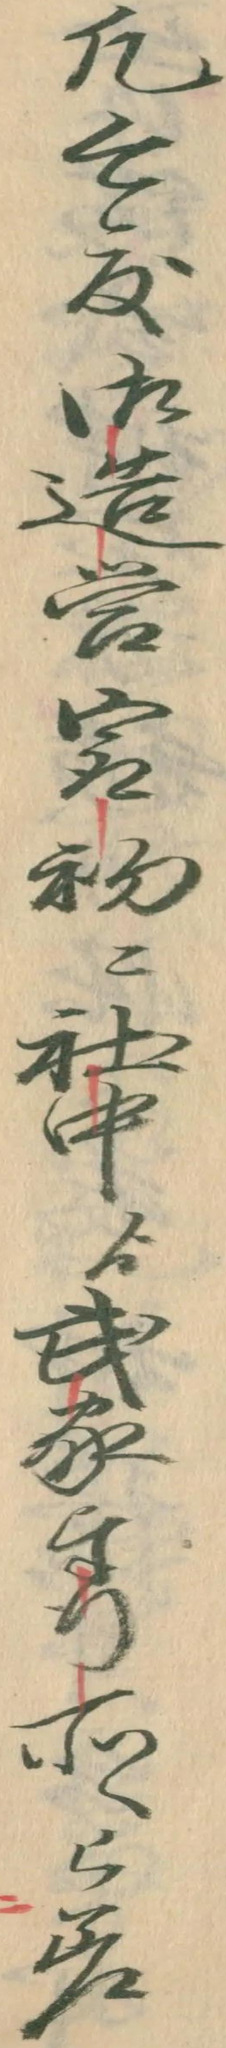凡今度御-造-営最-初ニ社-中ゟ武-家奉-行-所へ被差

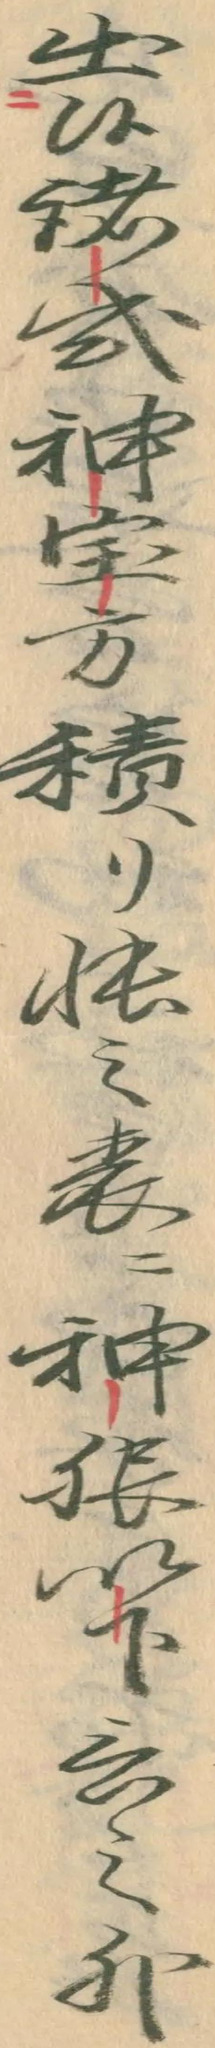出候諸-式神-宝-方積り帳之表ニ神-張以-下言之外
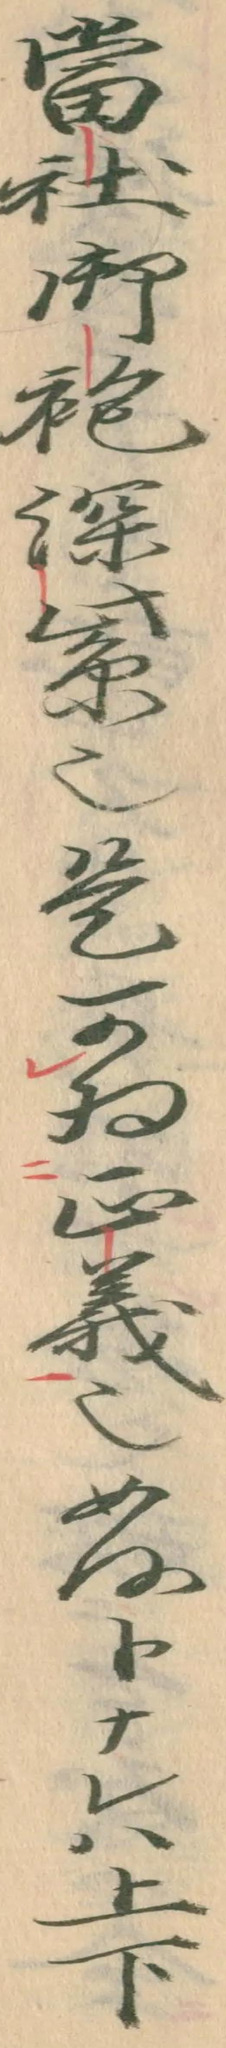当-社御-袍深_紫也是可為正-義也如何トナレハ上下
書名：賀茂社記録. 第16冊
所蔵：国立国会図書館 National Diet Library, JAPAN
